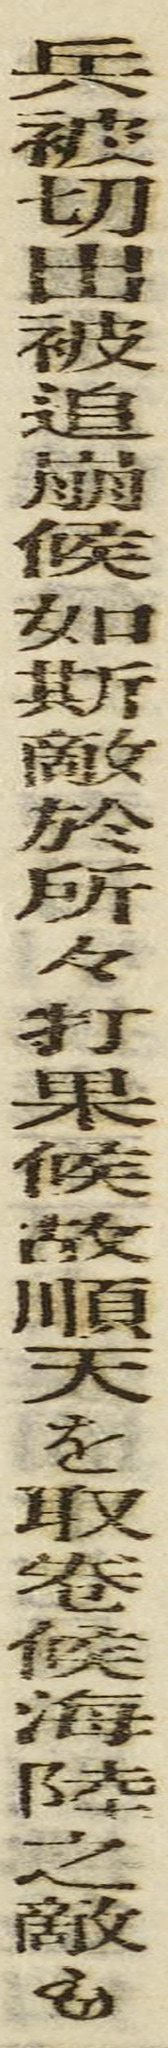兵被切出被追崩候如斯敵於所々打果候故順天を取巻候海陸之敵も
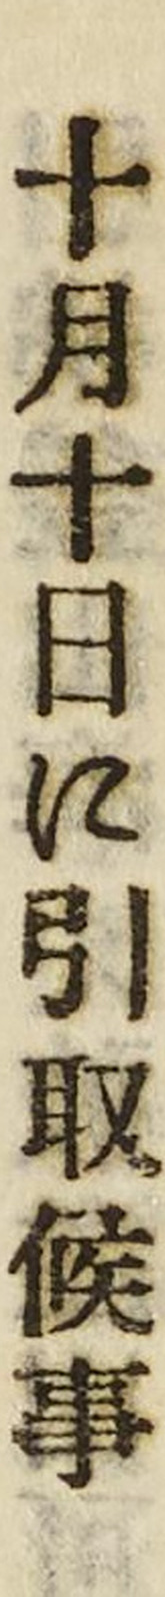十月十日に引取候事
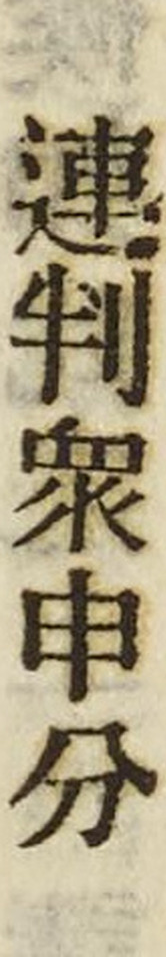連判衆申分
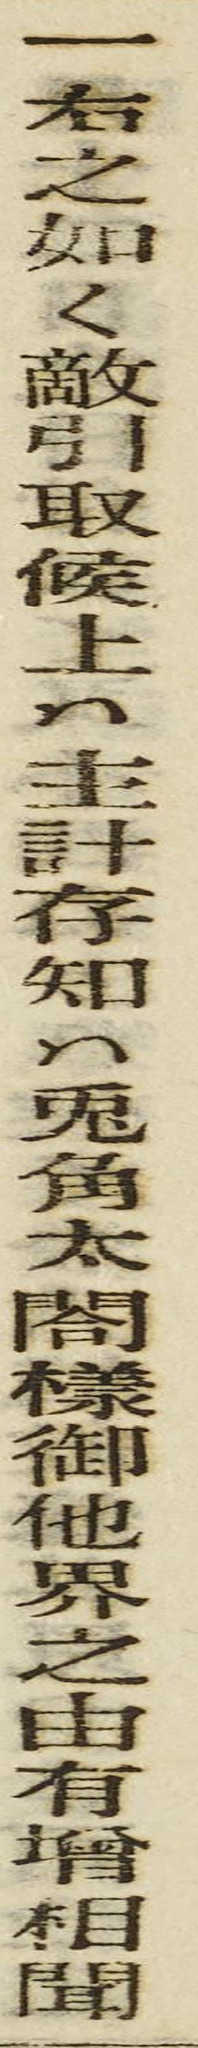一右之如く敵引取候上は主計存知は兎角太閤様御他界之由有増相聞
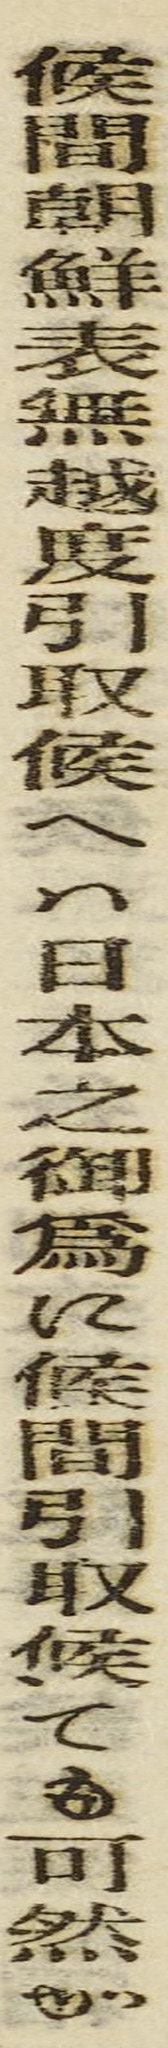候間朝鮮表無越度引取候へは日本之御為に候間引取候ても可然か
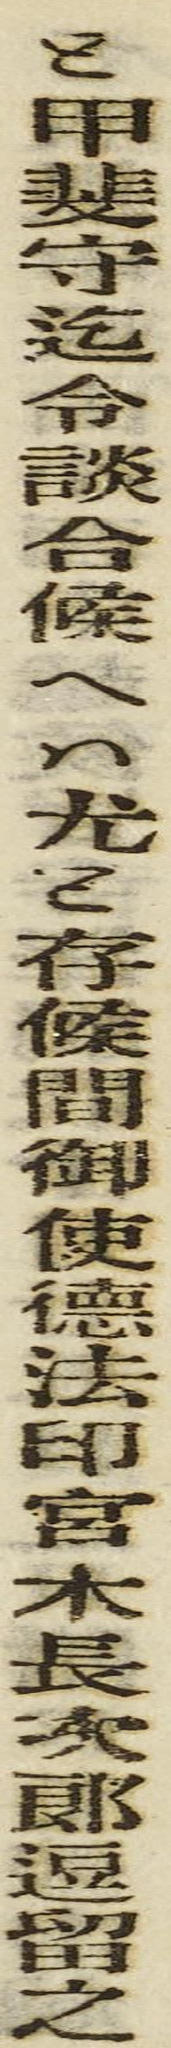と甲斐守迄令談合候へは尤と存候間御使徳法印宮木長次郎逗留之
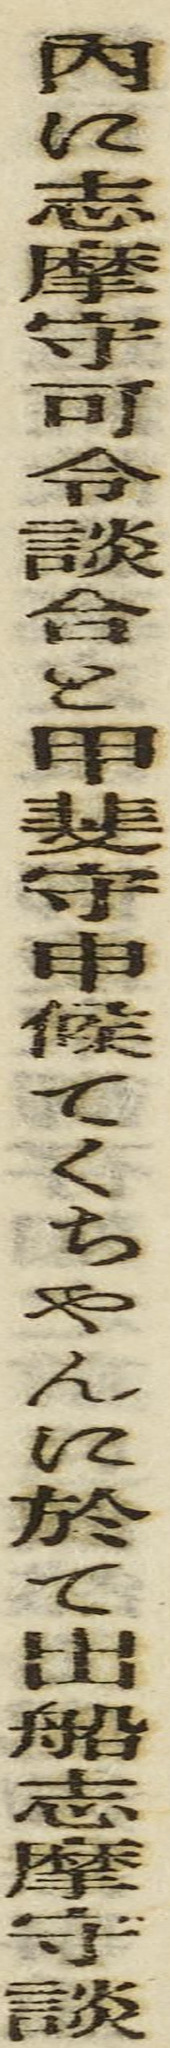内に志摩守可令談合と甲斐守申候てくちやんに於て出船志摩守談
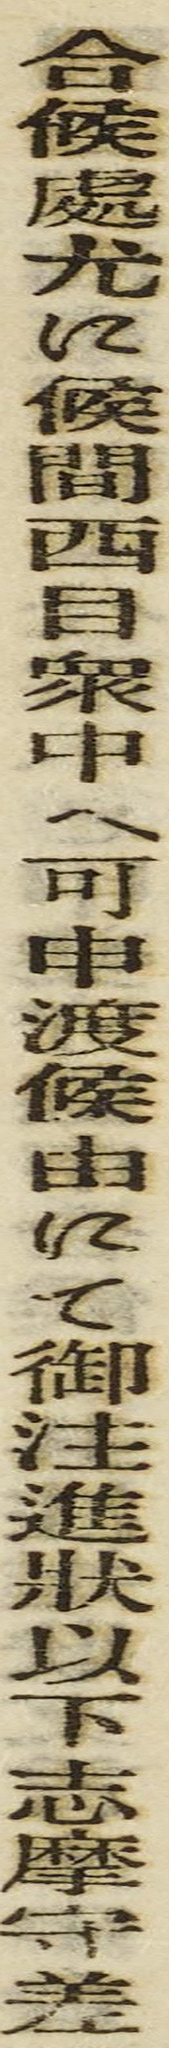合候処尤に候間西目衆中へ可申渡候由にて御注進状以下志摩守差

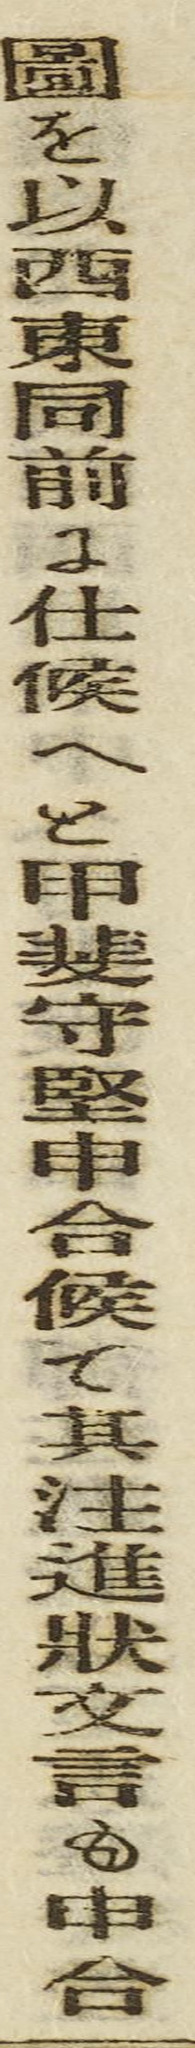図を以西東同前に仕候へと甲斐守堅申合候て其注進状文言も申合
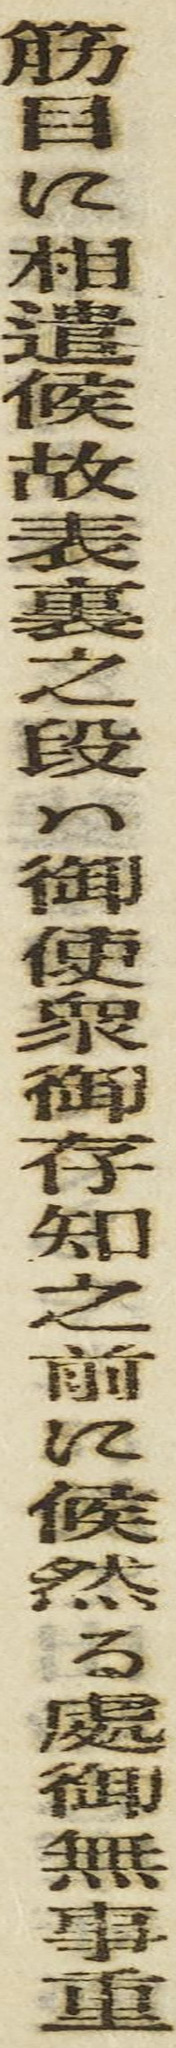筋目に相遣候故表裏之段ハ御使衆御存知之前に候然る処御無事重
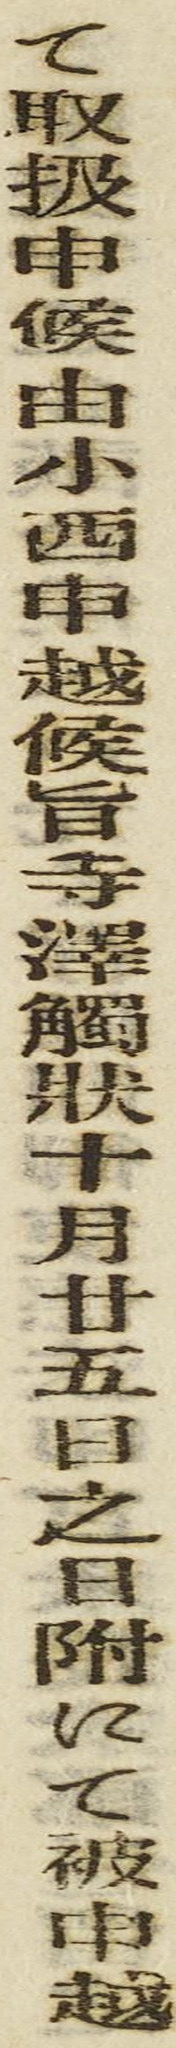て取扱申候由小西申越候旨寺沢觸状十月廿五日之日付にて被申越
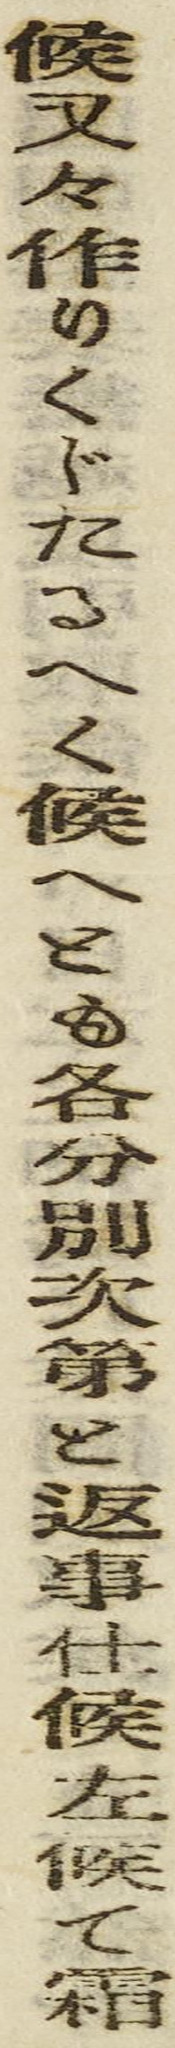候又々作りくじたるへく候へとも各分別次第と返事仕候左候て霜
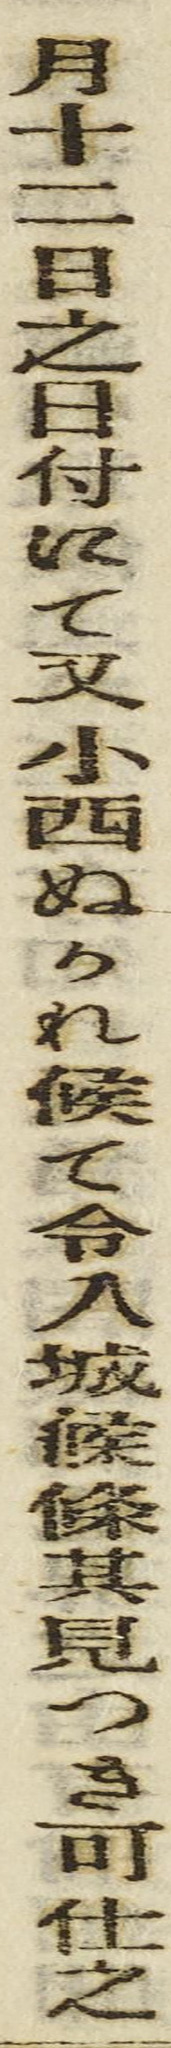月十二日之日付にて又小西ぬかれ候て令入城候条其見つき可仕之
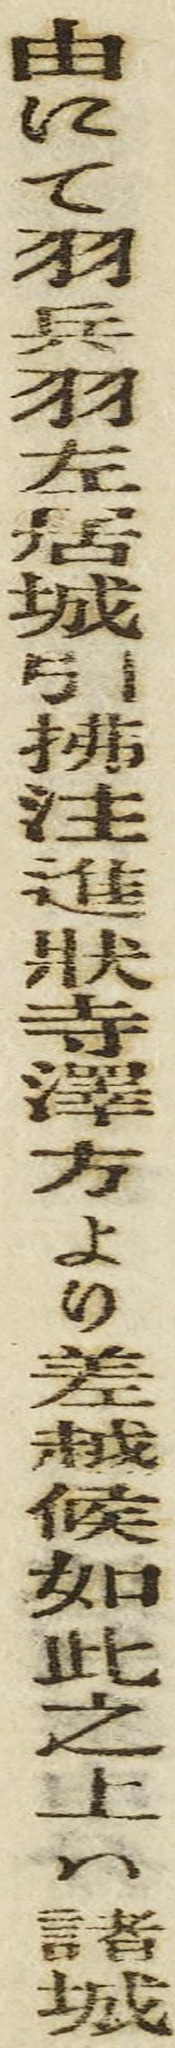由にて羽兵羽左居城引払注進状寺沢方より差越候如此之上ハ諸城
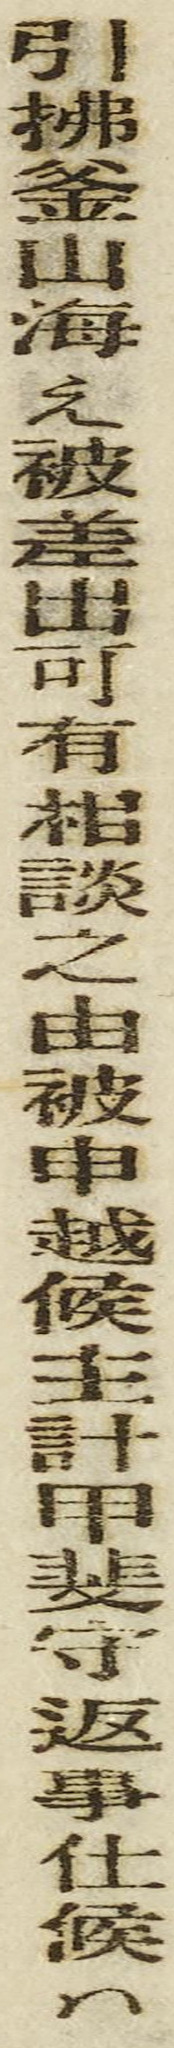引払釜山海え被差出可有相談之由被申越候主計甲斐守返事仕候ハ
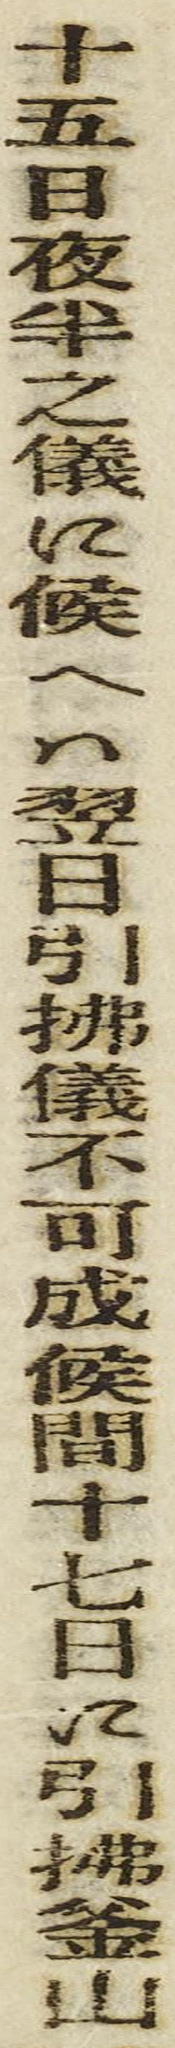十五日夜半之儀に候へハ翌日引払儀不可成候間十七日に引払釜山
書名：史籍集覽　朝鮮陣古文・細井廣澤記・颶風紀事・天明七年將軍宣下次第書　全
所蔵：東京大学地震研究所図書室 Earthquake Research Institute Library, The University of Tokyo, JAPAN
